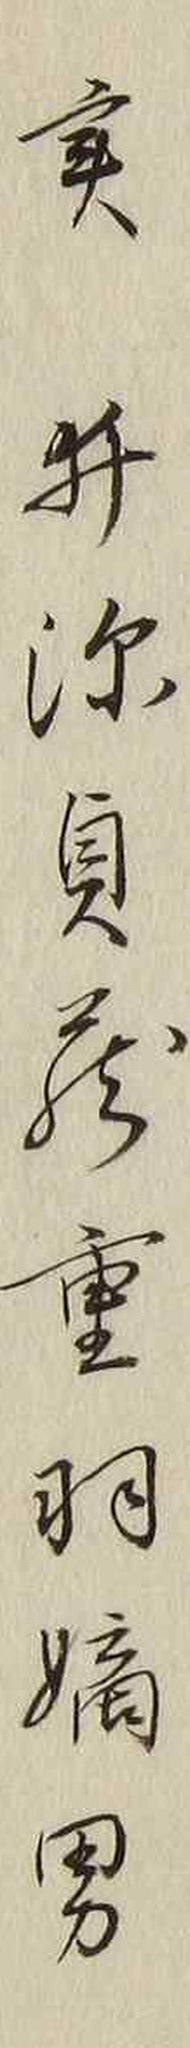実井深貞蔵重羽嫡男
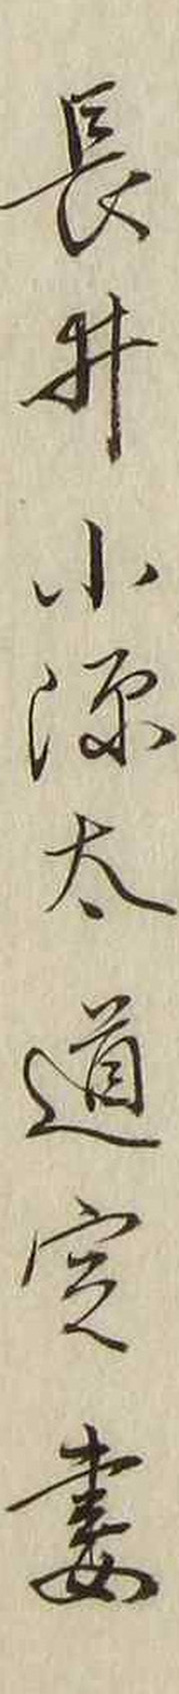女長井小源太道定妻

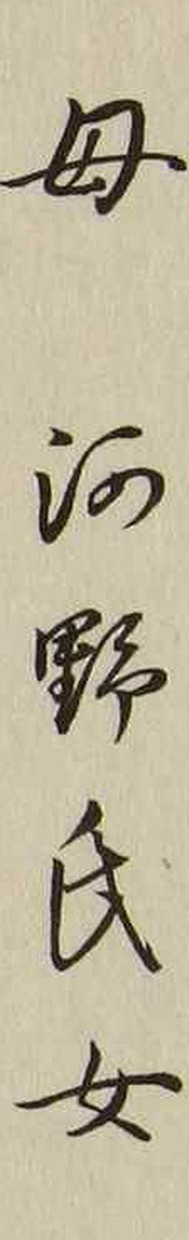母河野氏女
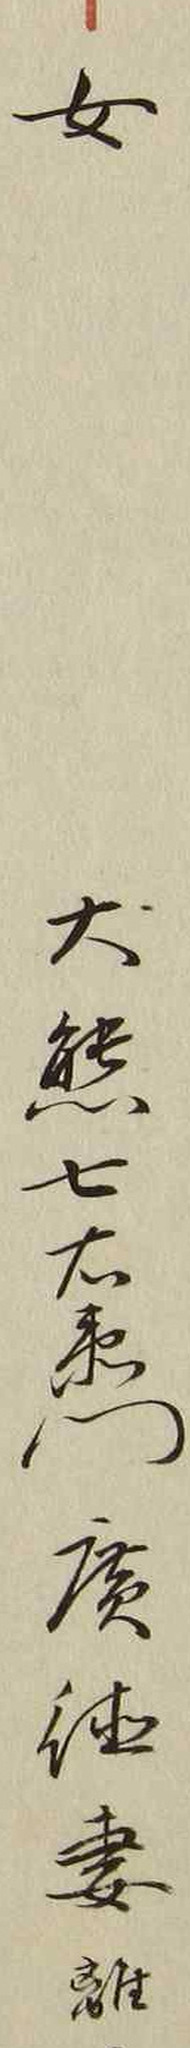女大熊七右衛門広徳妻離別
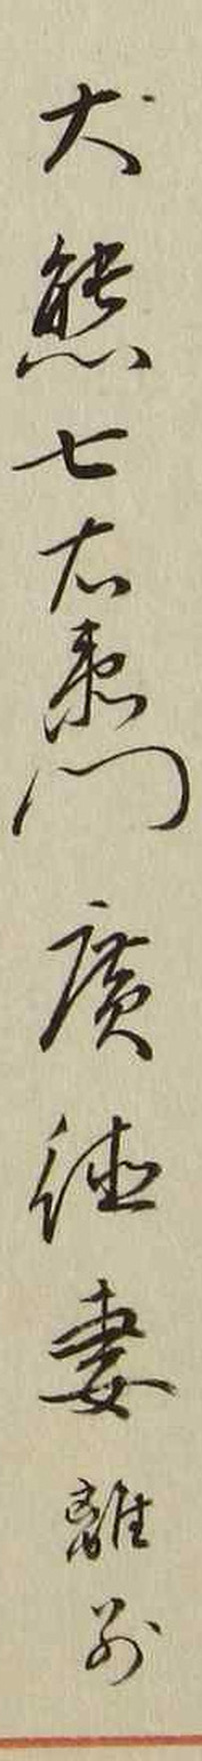女大熊七右衛門広徳妻離別
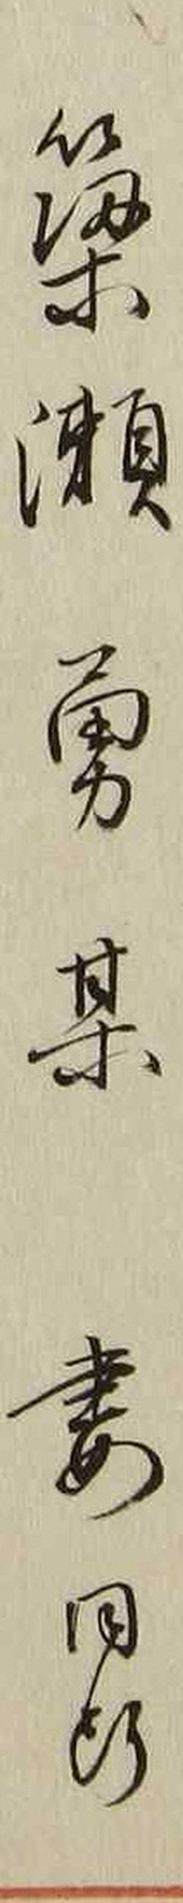簗瀬勇某妻同断
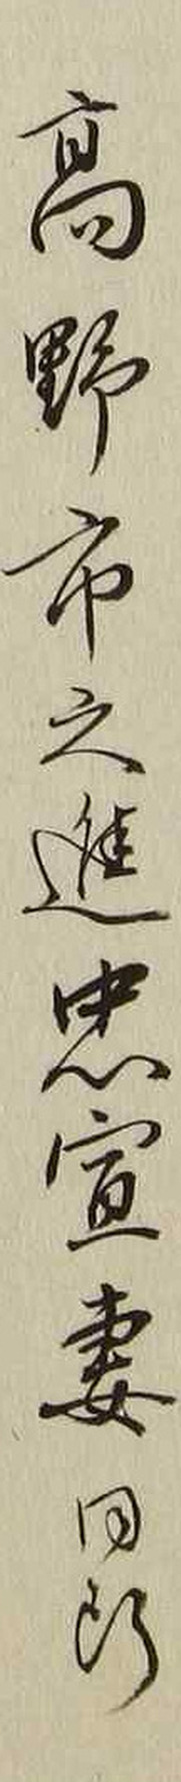高野市之進忠宣妻同断
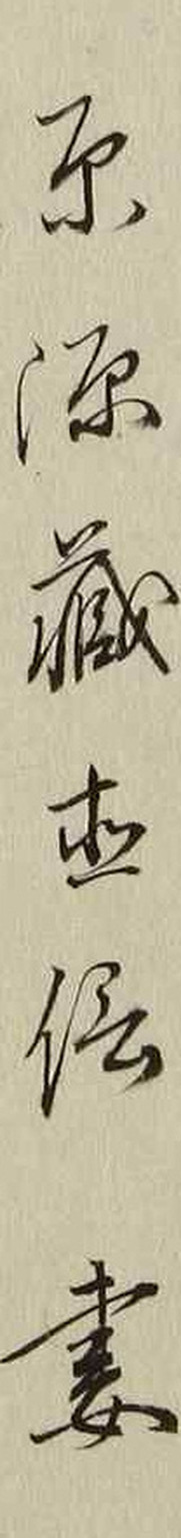原源蔵直信妻
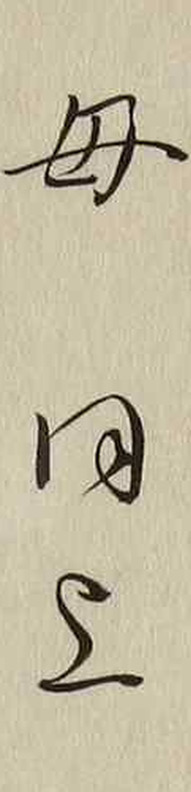母同上
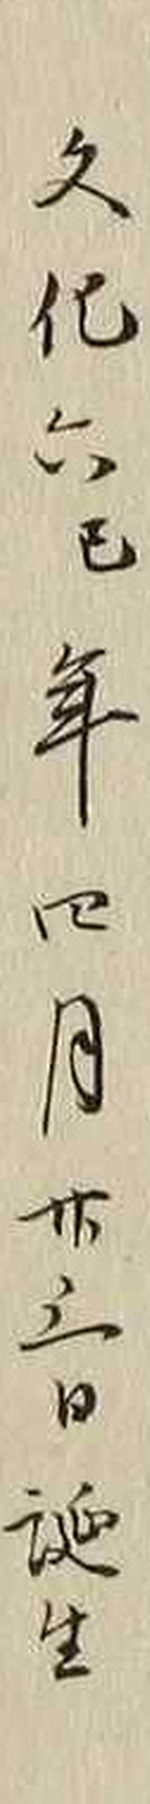文化六巳年四月廿三日誕生
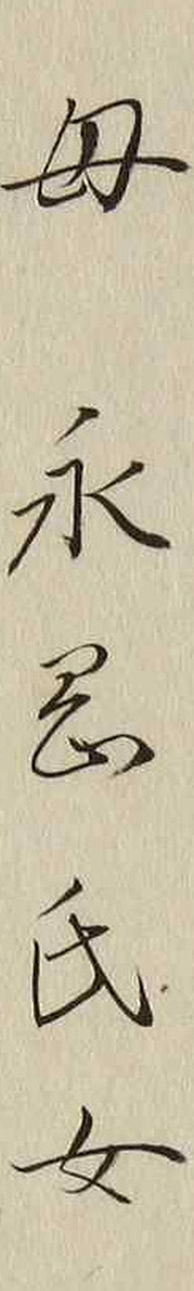母永岡氏女
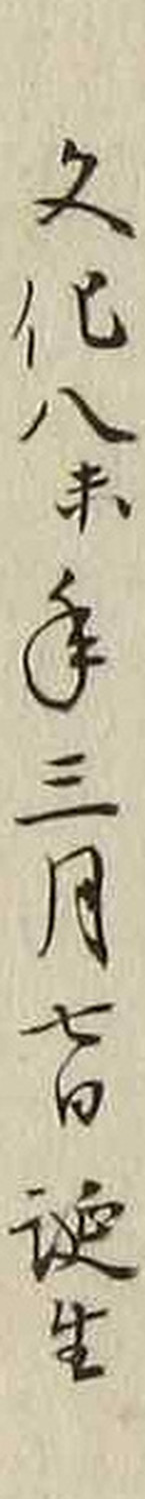文化八未年三月七日誕生
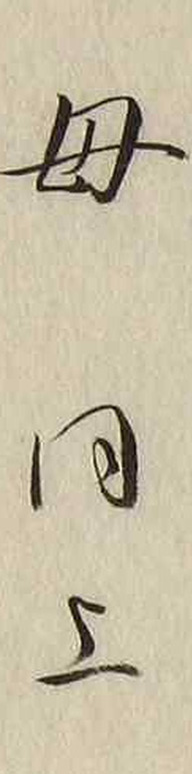母同上

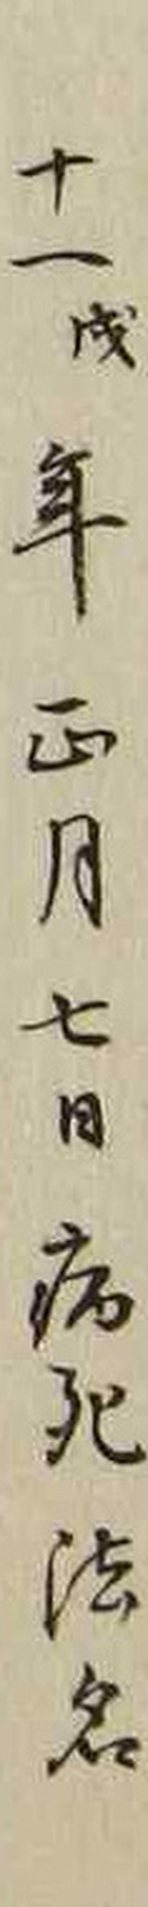十一戌年正月七日病死法名
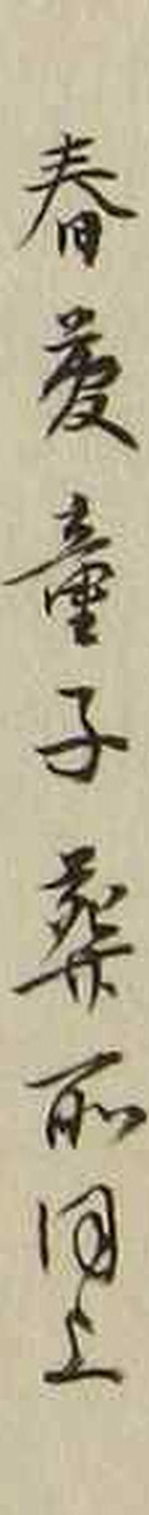春夢童子葬所同上
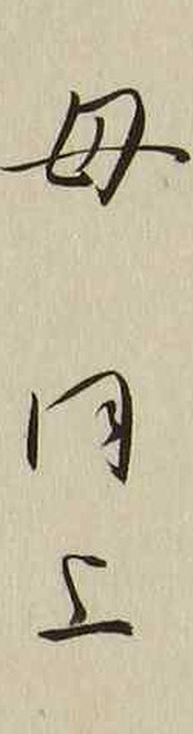母同上
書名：諸士系譜　巻之22　い之部22
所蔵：会津若松市立会津図書館
